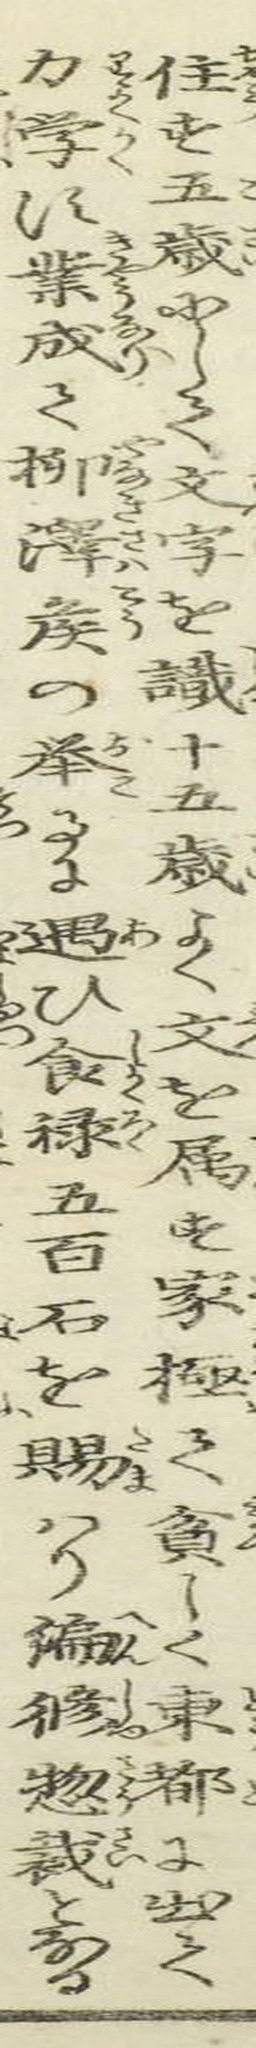力学す業成て柳澤侯の挙るに遇ひ食禄五百石を賜はり編修惣裁となる
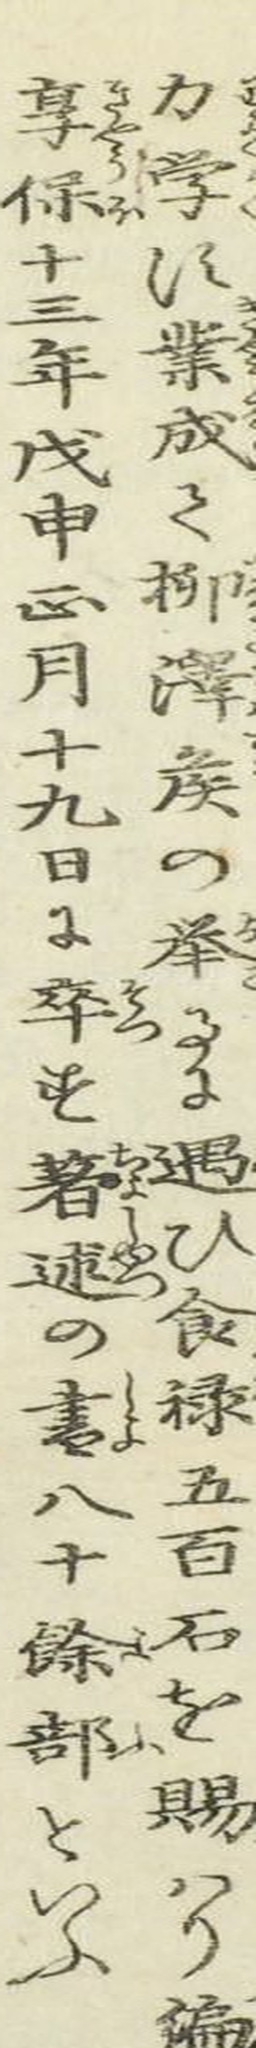享保十三年戊申正月十九日に卒す著述の書八十餘部といふ
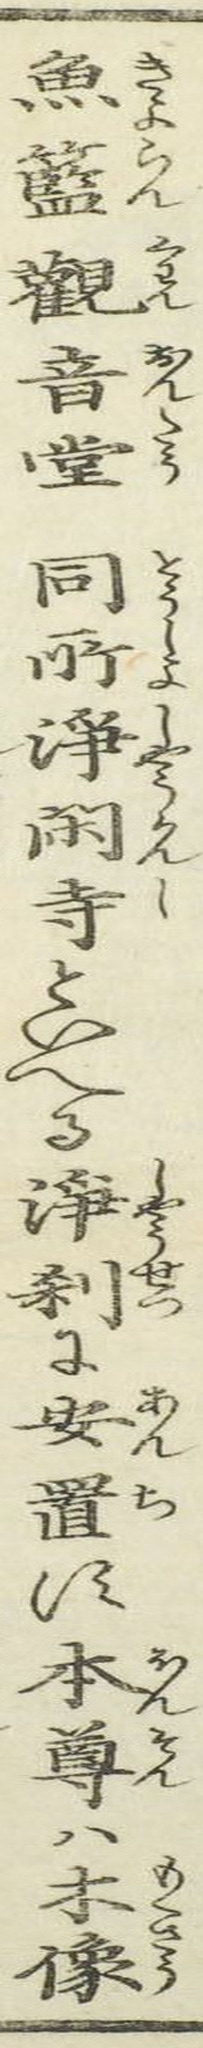魚籃観音堂同所浄閑寺といへる浄刹に安置す本尊は木像
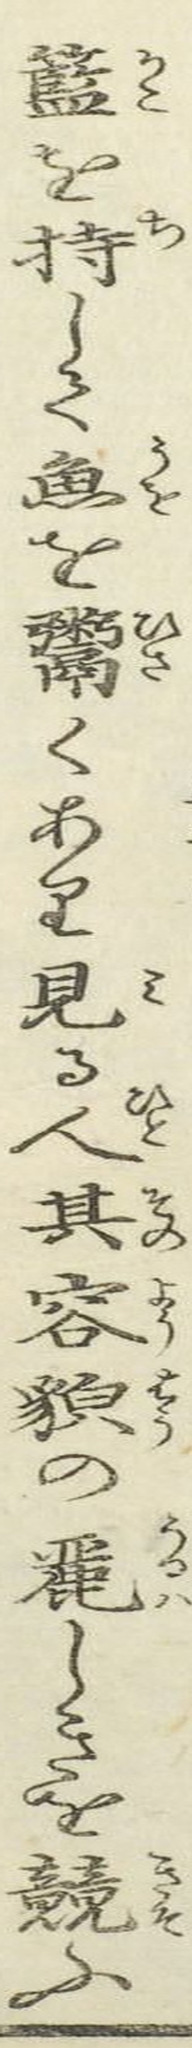籃を持して魚を鬻くあり見る人其容貌の麗しきを競ふ
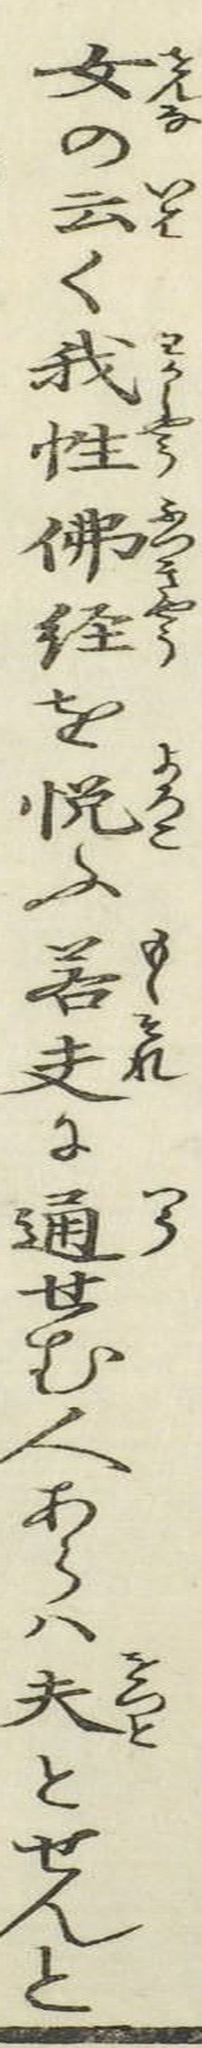女の云く我性佛経を悦ふ若夫に通せむ人あらは夫とせんと
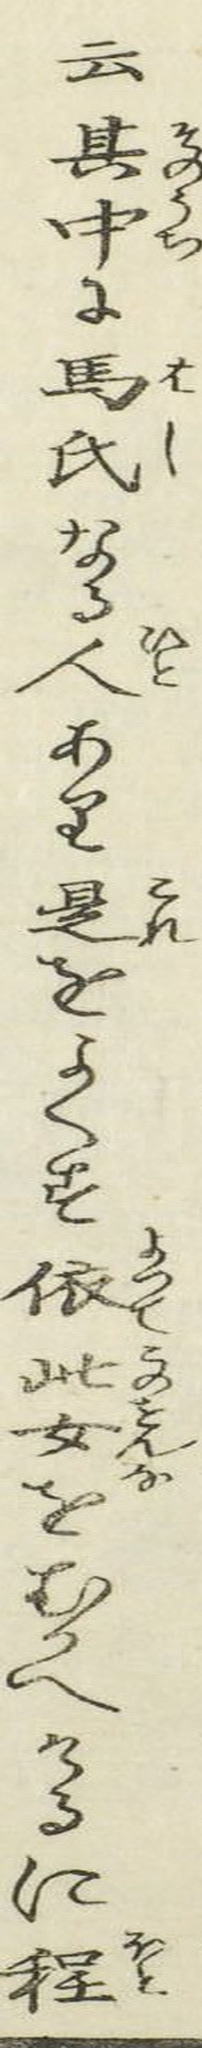云其中に馬氏なる人あり是をよくす依此女をむかへけるに程
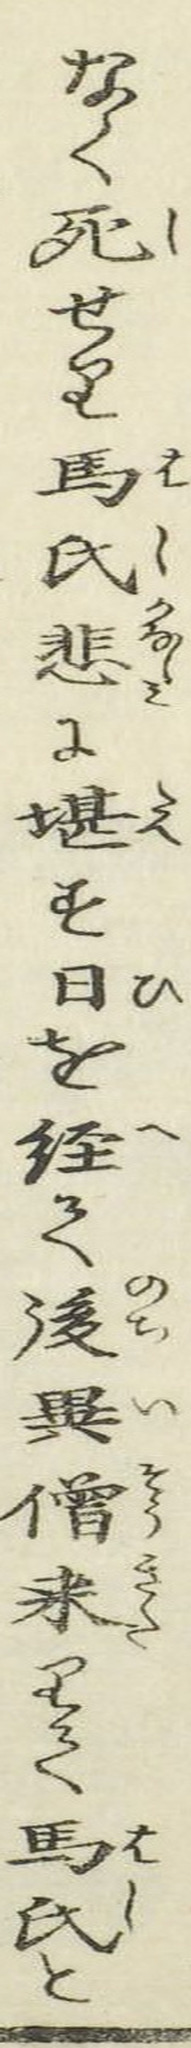なく死せり馬氏悲に堪す日を経て後異僧来りて馬氏と
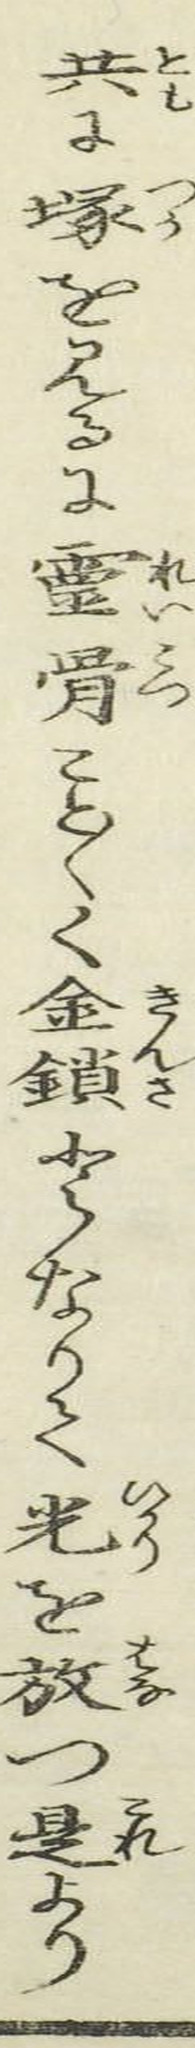共に塚を見るに霊骨こと〳〵く金鎖となりて光を放つ是より
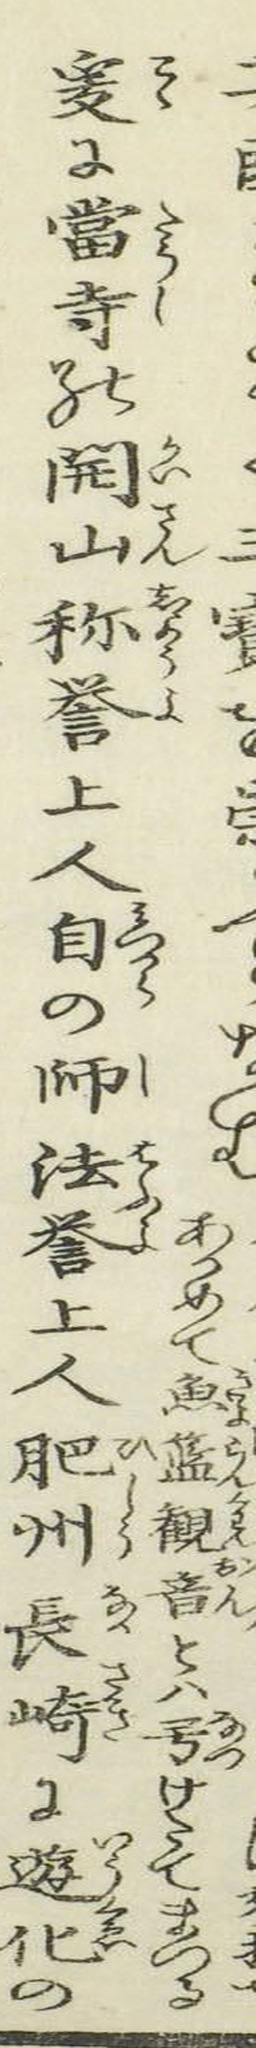爰に當寺の開山称誉上人自の師法誉上人肥州長崎に遊化の
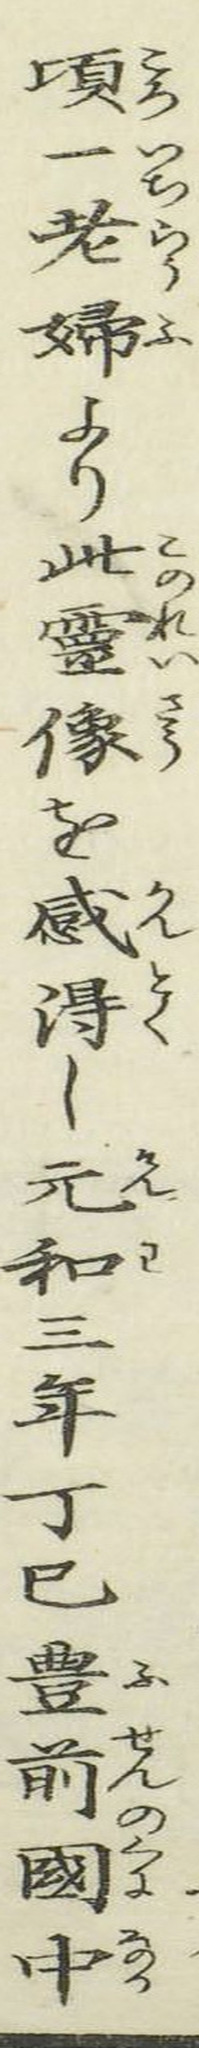頃一老婦より此霊像を感得し元和三年丁巳豊前國中
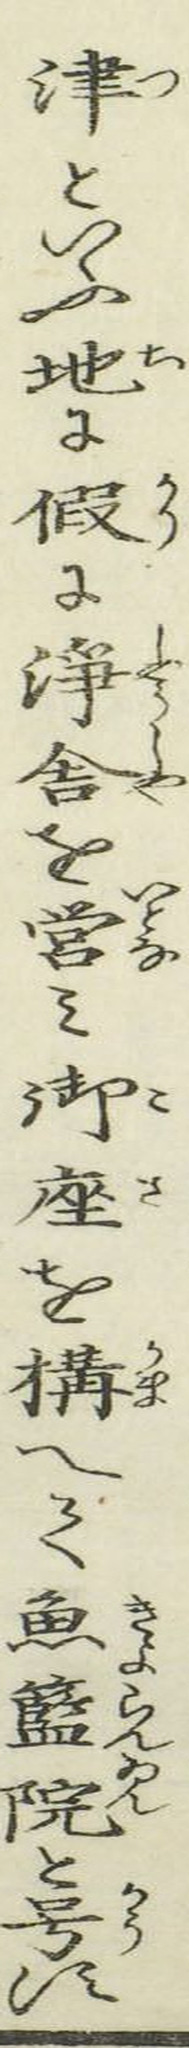津といふ地に假に浄舎を営み御座を構へて魚籃院と号す
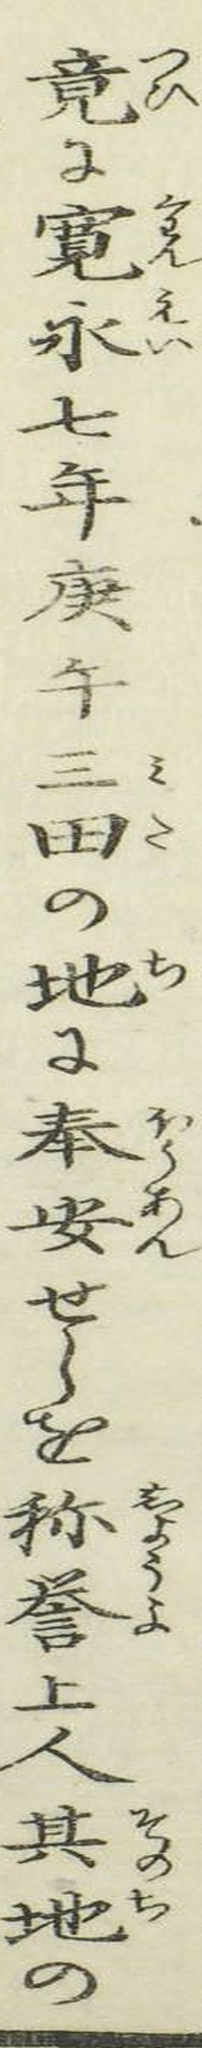竟に寛永七年庚午三田の地に奉安せしを称誉上人其地の
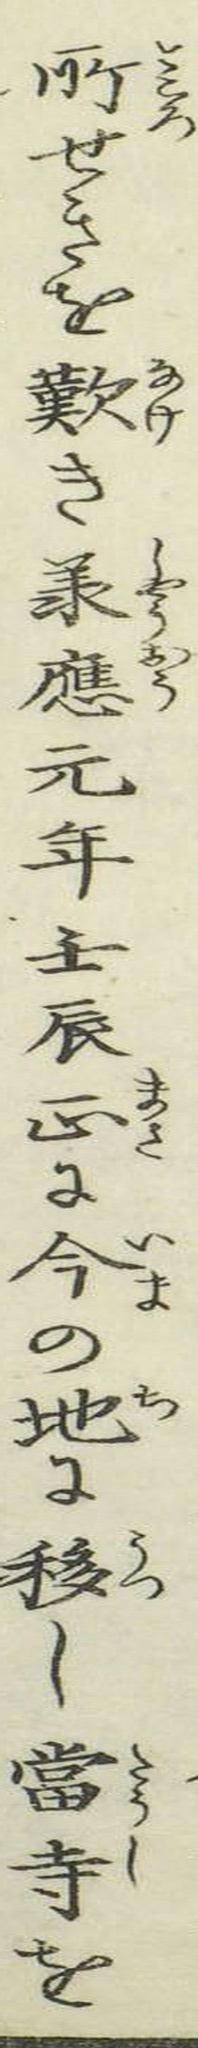所せきを歎き承應元年壬辰正に今の地に移し當寺を
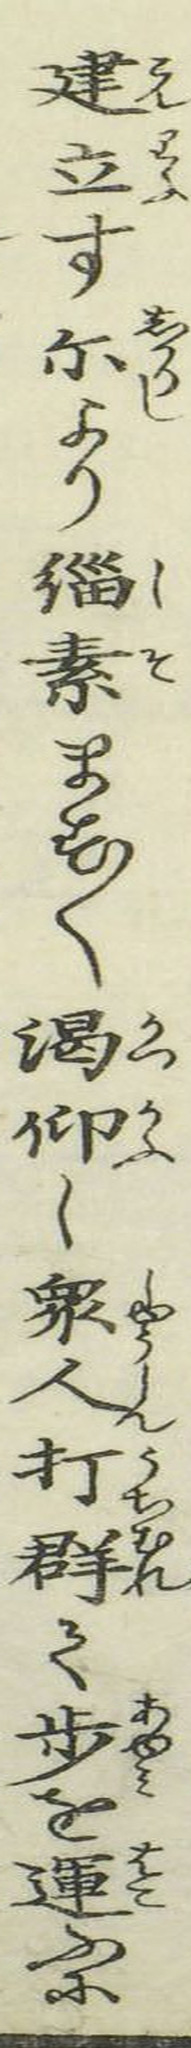建立す尓より緇素ます〳〵渇仰し衆人打群て歩を運ふに
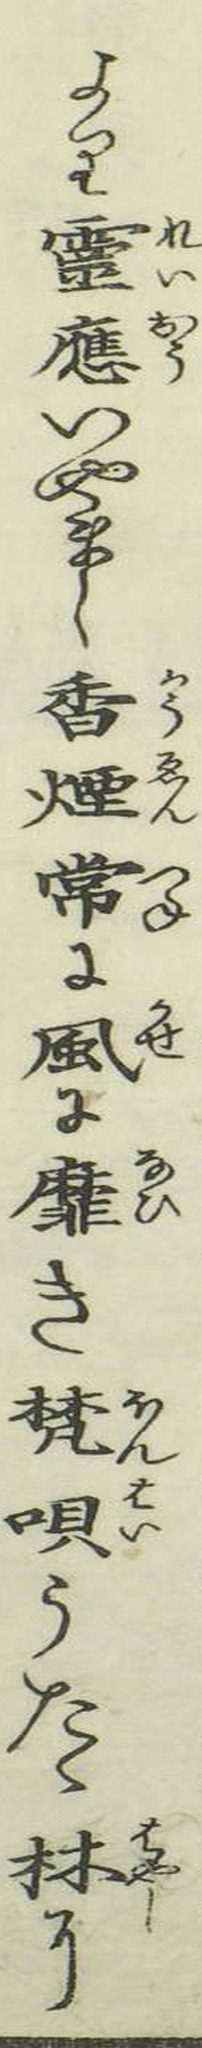より霊應いやまし香煙常に風に靡き梵唄うたゝ林に
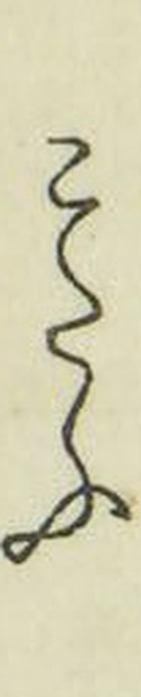こたふ
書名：江戸名所図会 20巻 巻之3
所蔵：東京学芸大学教育コンテンツアーカイブ
